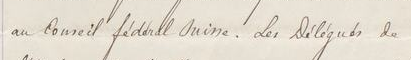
au Conseil fédéral Suisse. Les Délégués de
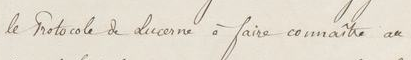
le Protocole de Lucerne à faire connaître au
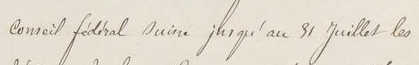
Conseil fédéral Suisse jusqu'au 31 Juillet les
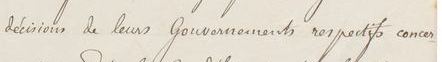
décisions de leurs Gouvernements respectifs concer-
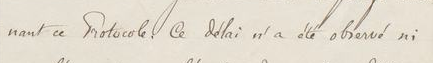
nant ce Protocole. Ce délai n'a été observé ni
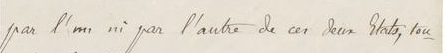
par l'un ni par l'autre de ces deux Etats, tou-
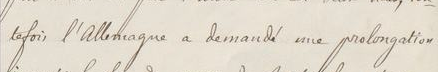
tefois l'Allemagne a demandé une prolongation
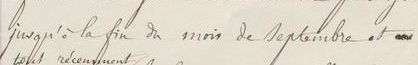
jusqu'à la fin du mois de Septembre et ces
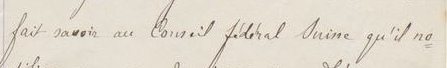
fait savoir au Conseil fédéral Suisse qu'il no-
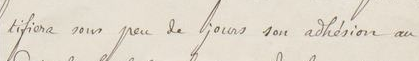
tifiera sous peu de jours son adhésion au
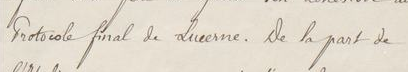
Protocole final de Lucerne. De la part de
